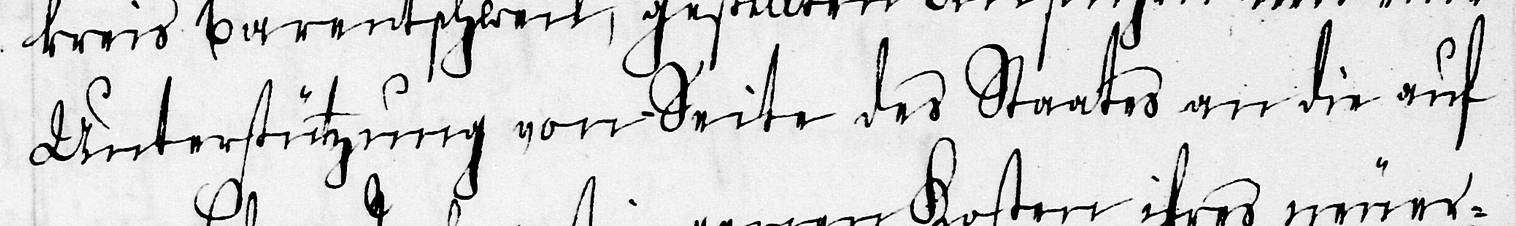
Unterstützung von Seite des Staates an die auf
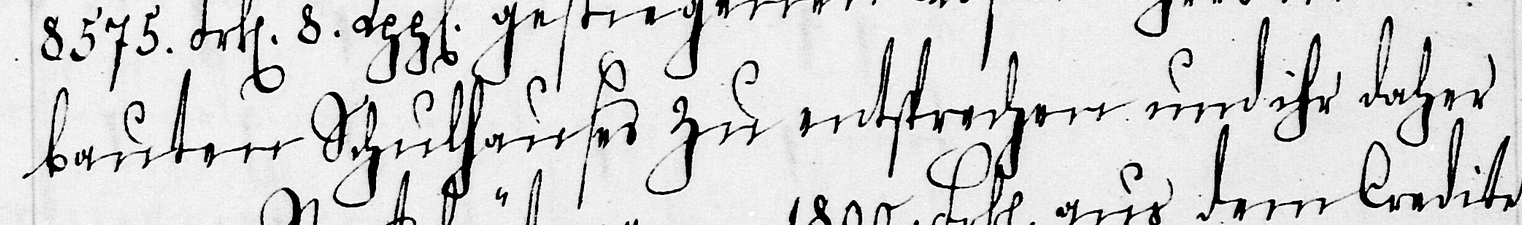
bauten Schulhauses zu entsprechen und ihr daher
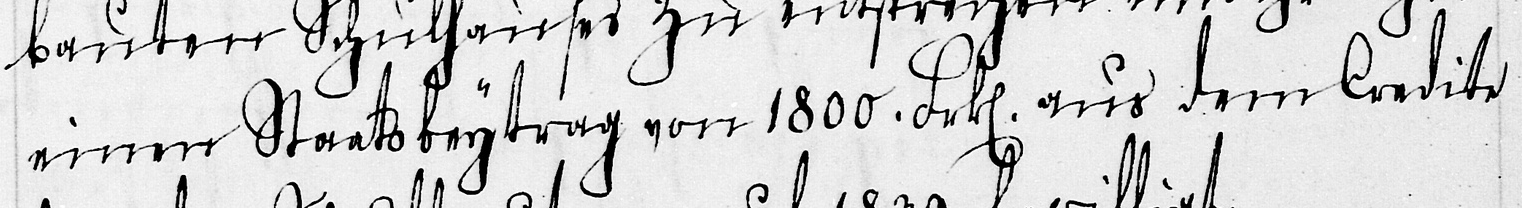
einen Staatsbeytrag von 1800. Frk[en]. aus dem Credite
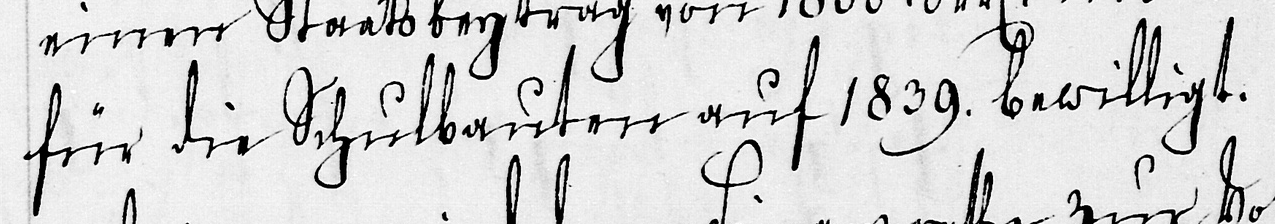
für die Schulbauten auf 1839. bewilligt.
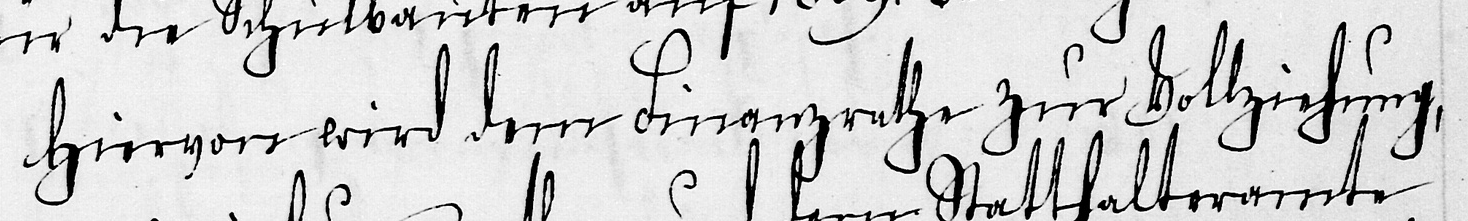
Hiervon wird dem Finanzrathe zur Vollziehung,
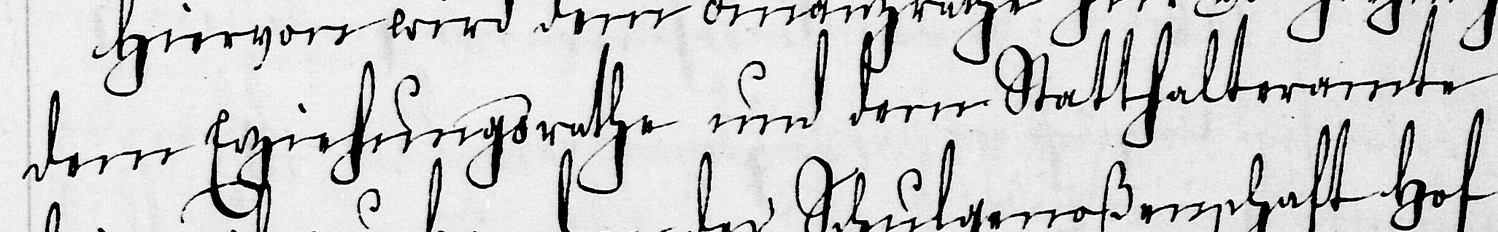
dem Erziehungsrathe und dem Statthalteramte
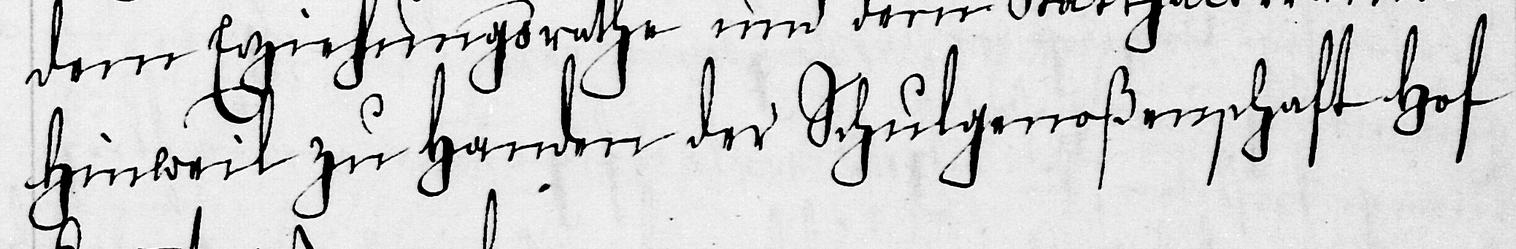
Hinweil zu Handen der Schulgenoßenschaft Hof
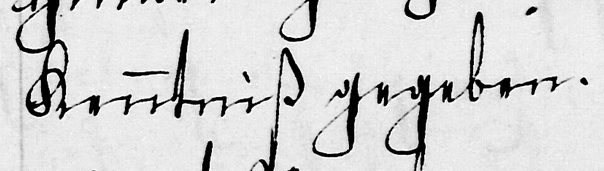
Kenntniß gegeben.
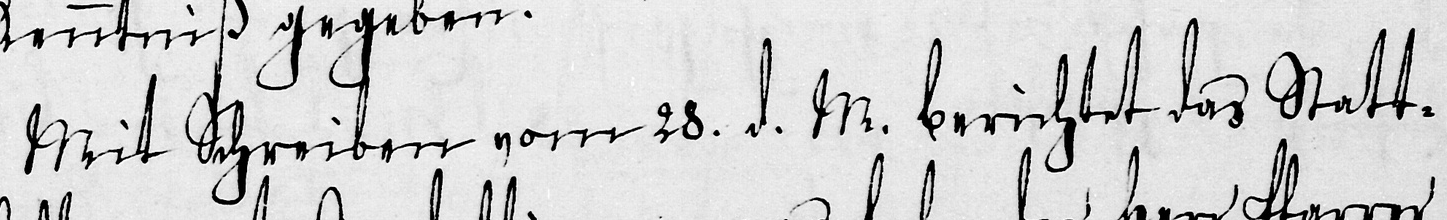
Mit Schreiben vom 28. d. M. berichtet das Statt¬
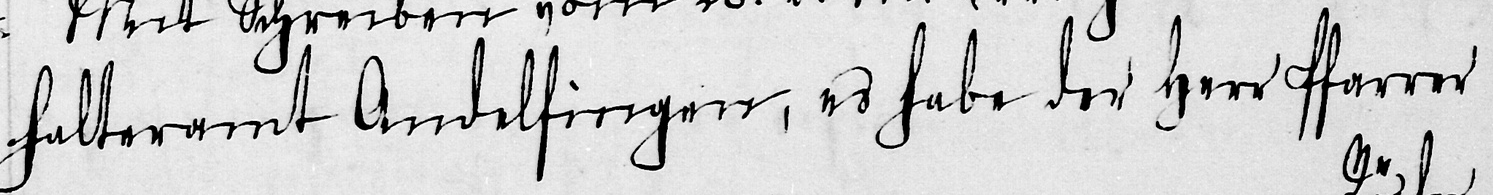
halteramt Andelfingen, es habe der Herr Pfarrer
